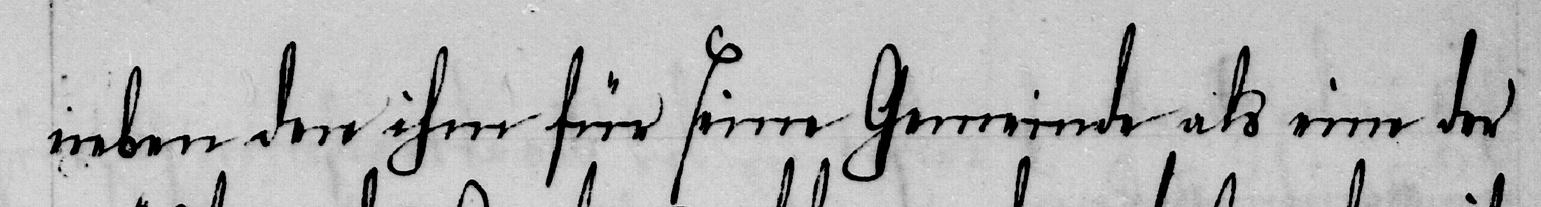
neben den ihm für seine Gemeinde als eine der
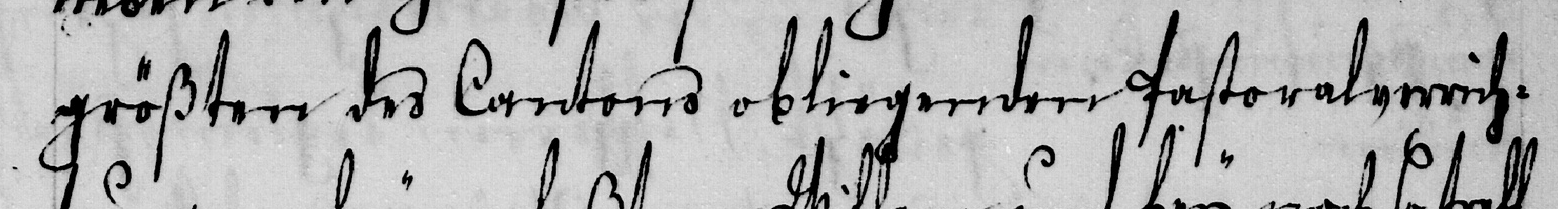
größten des Cantons obliegenden Pastoralverrich¬
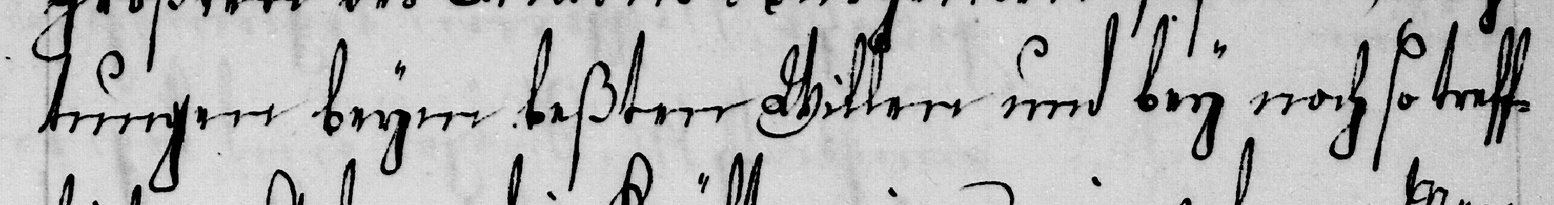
tungen beym beßten Willen und bey noch so tref¬
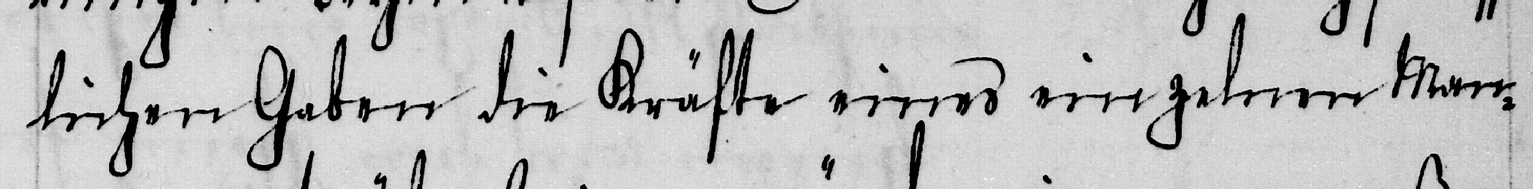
flichen Gaben die Kräfte eines einzelnen Man¬
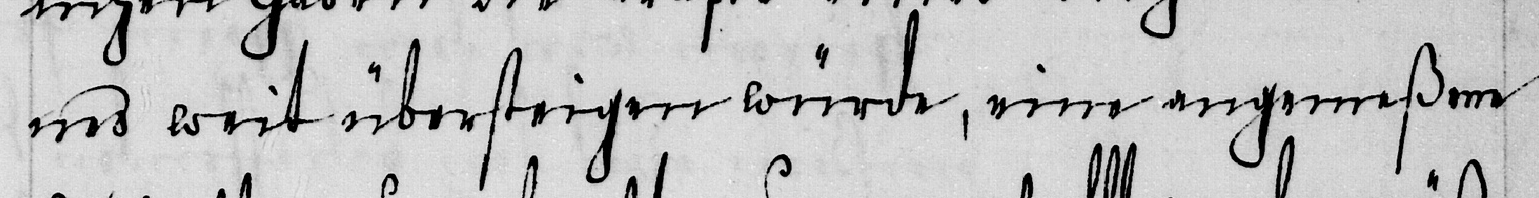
nes weit übersteigen würde, eine angemeßene
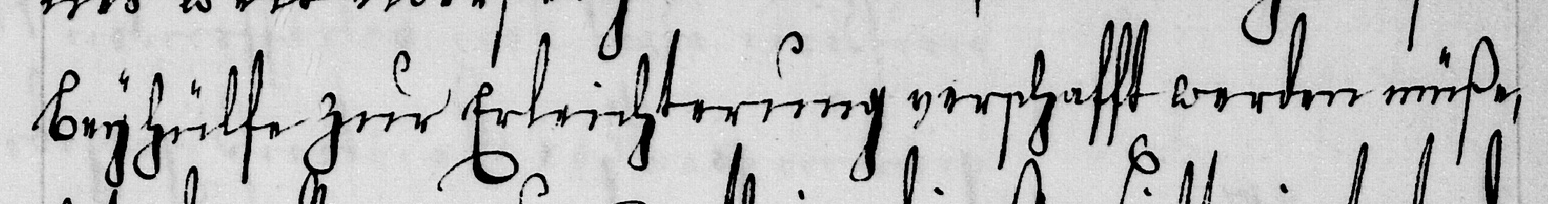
Beyhülfe zur Erleichterung verschafft werden müße,
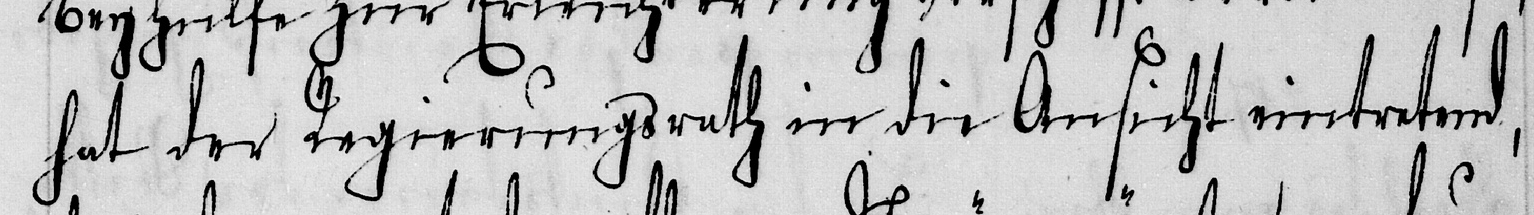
hat der Regierungsrath in die Ansicht eintretend,
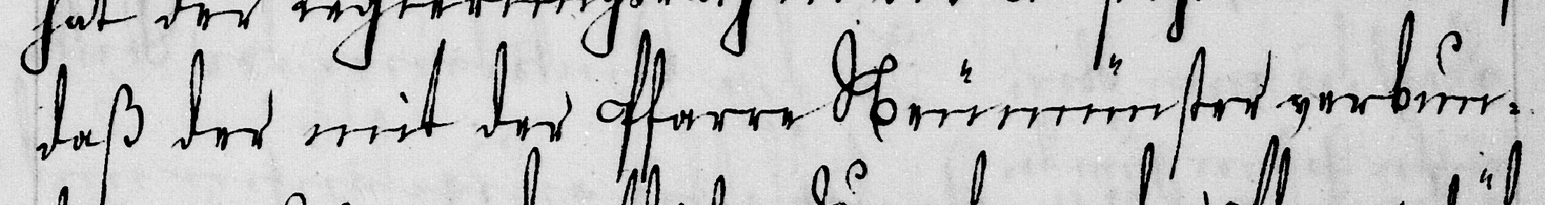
daß der mit der Pfarre Neumünster verbun¬
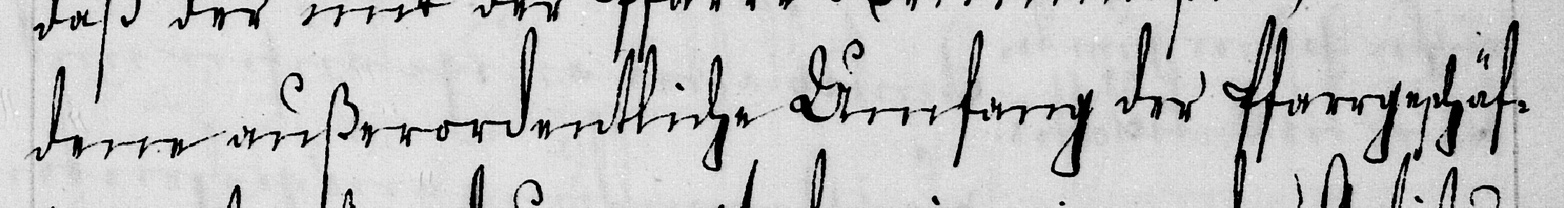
dene außerordentliche Umfang der Pfarrgeschäf¬
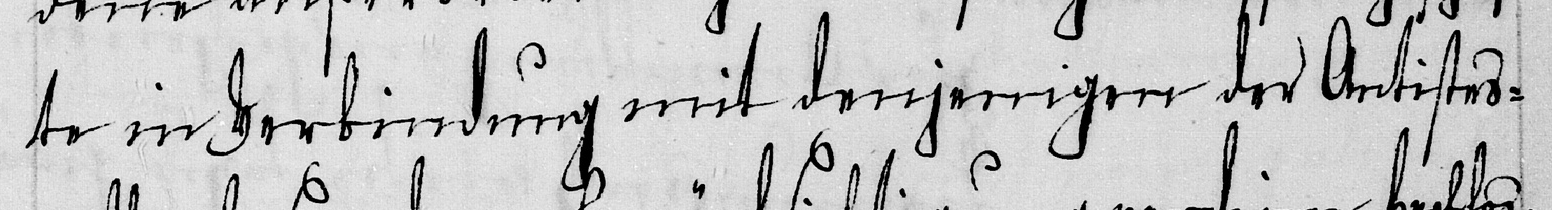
te in Verbindung mit denjenigen der Antistes¬
